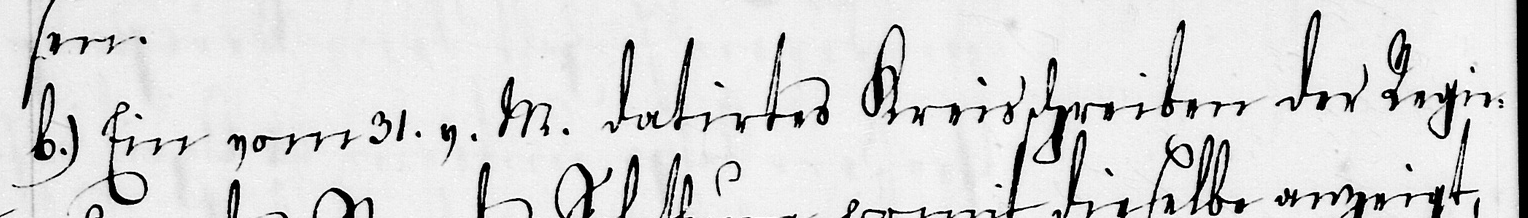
b.) Ein vom 31. v. M. datirtes Kreisschreiben der Regie¬
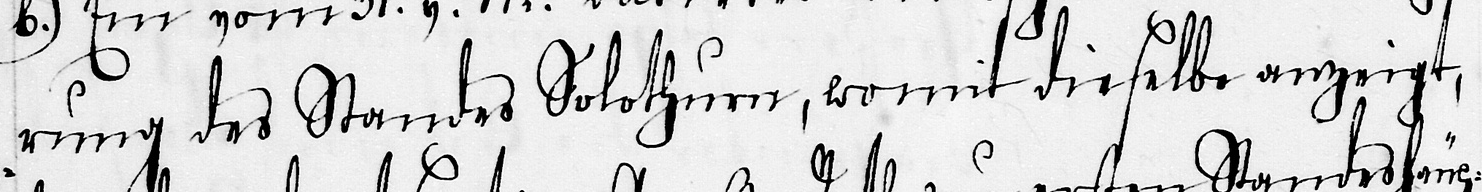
rung des Standes Solothurn, womit dieselbe angezeigt,
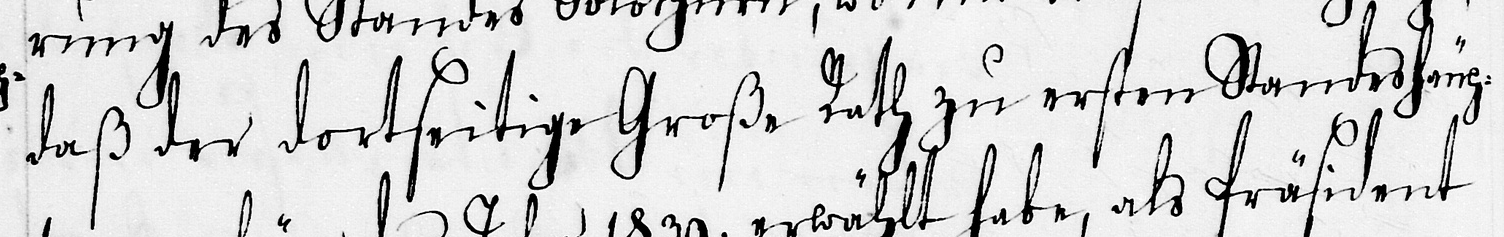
daß der dortseitige Große Rath zu ersten Standeshäup¬
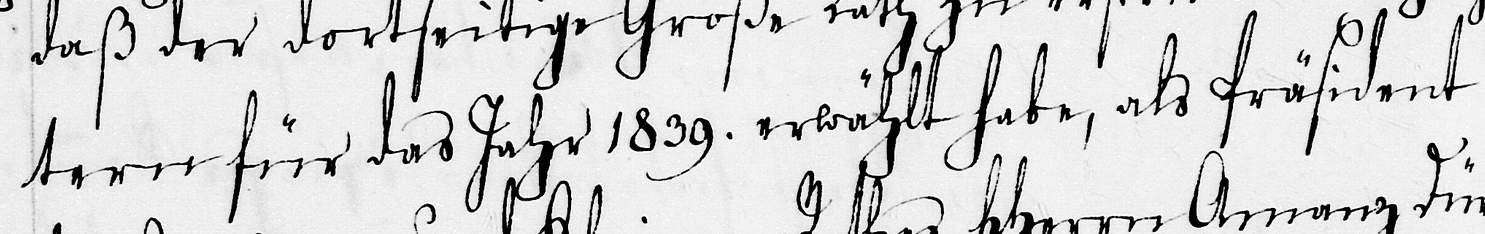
tern für das Jahr 1839. erwählt habe, als Präsident
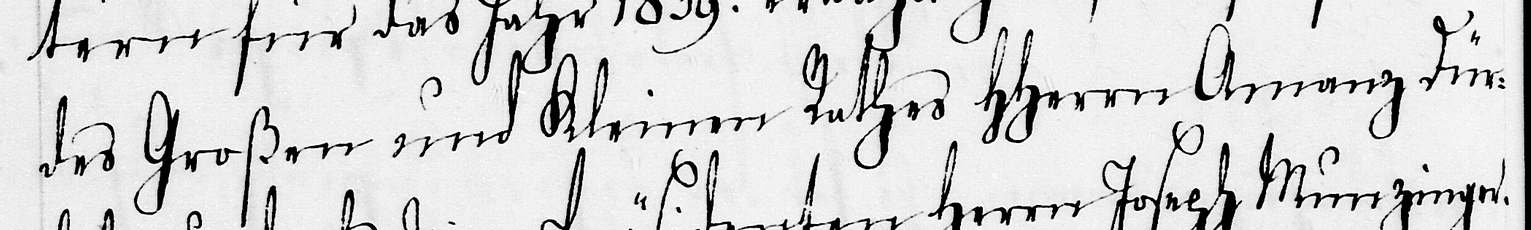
des Großen und Kleinen Rathes HHerrn Amanz Dür¬
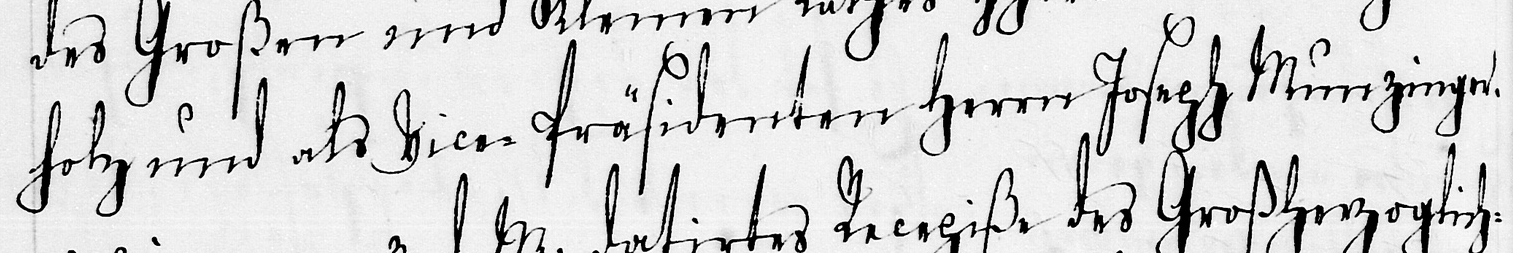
holz und als Vice-Präsidenten Herrn Joseph Munzinge¬
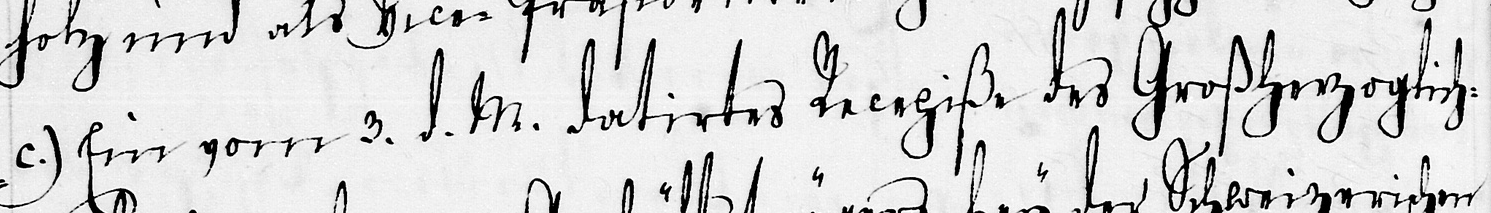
c.) Ein vom 3. d. M. datirtes Recepiße des Großherzoglic¬
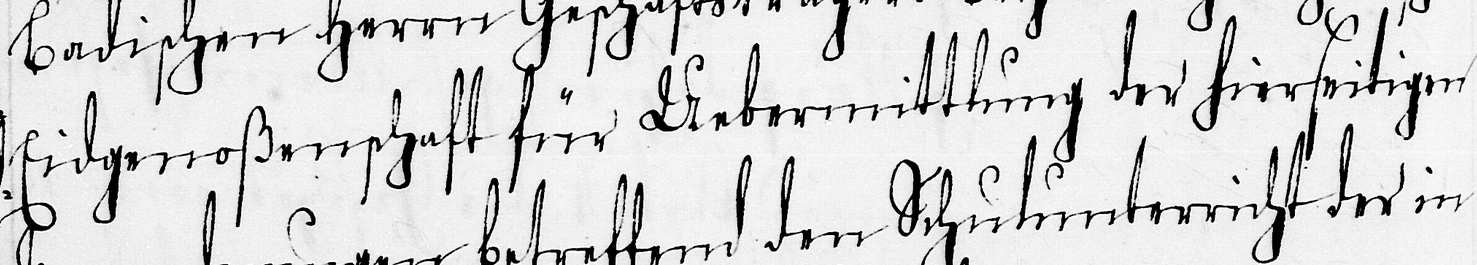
Eidgenoßenschaft für Uebermittlung der hierseitigen
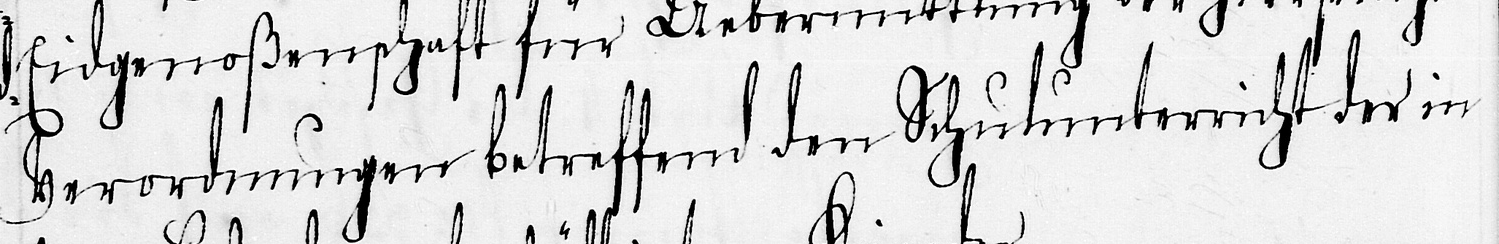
Verordnungen betreffend den Schulunterricht der in
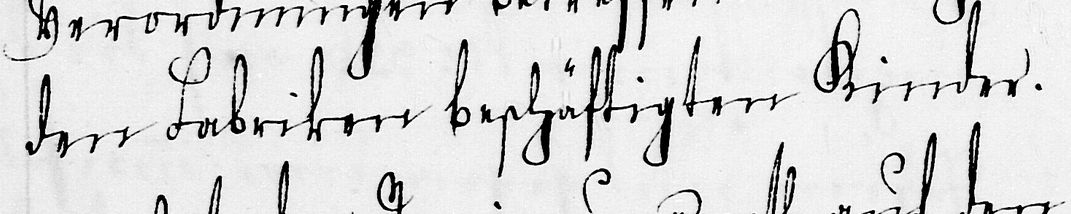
den Fabriken beschäftigten Kinder.
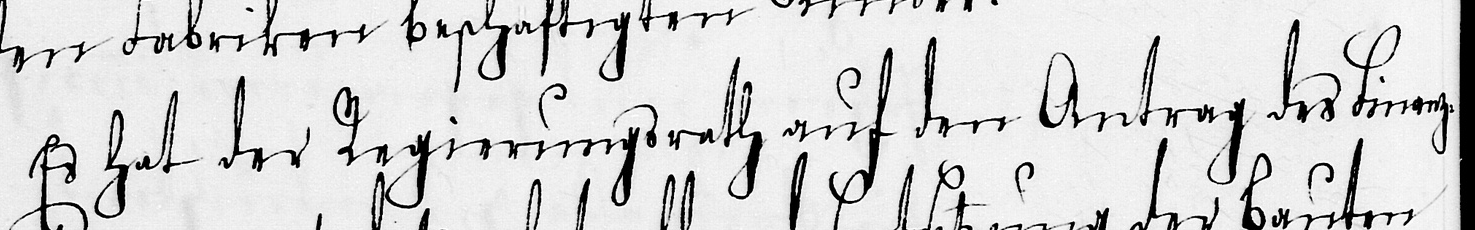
Es hat der Regierungsrath auf den Antrag des Finan¬
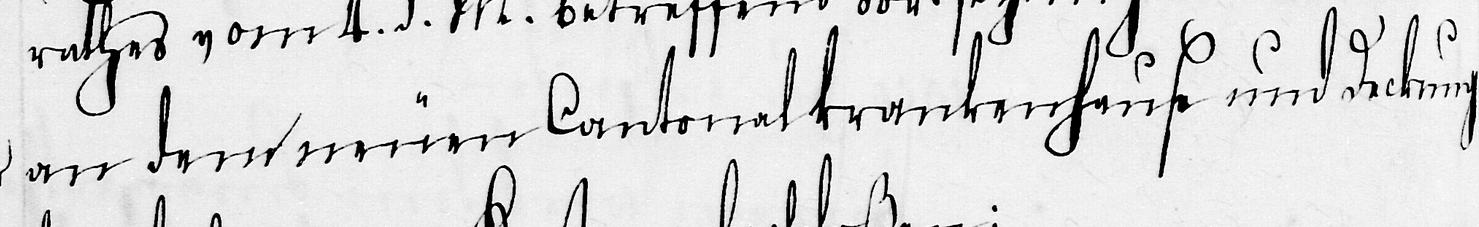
an dem neuen Cantonalkrankenhause und Decku¬
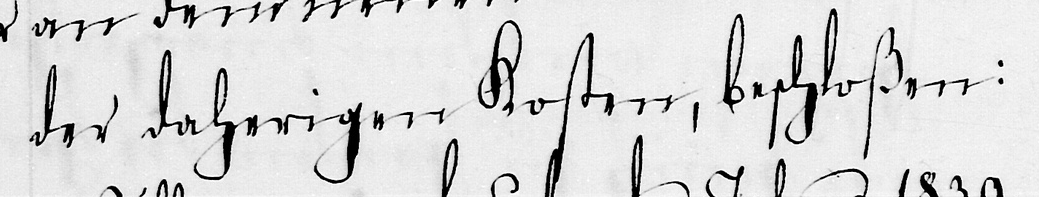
der daherigen Kosten, beschloßen:
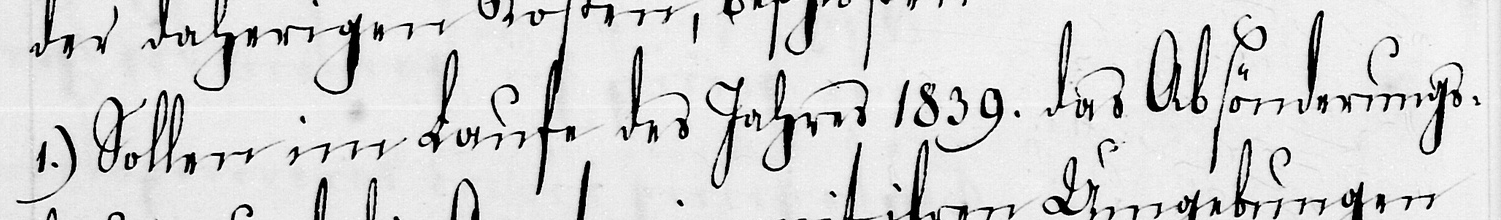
1.) Sollen im Laufe des Jahres 1839. das Absönderungs¬
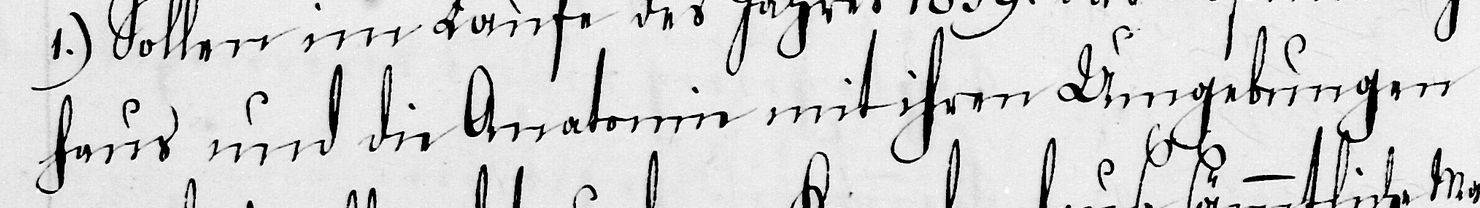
haus und die Anatomie mit ihren Umgebungen
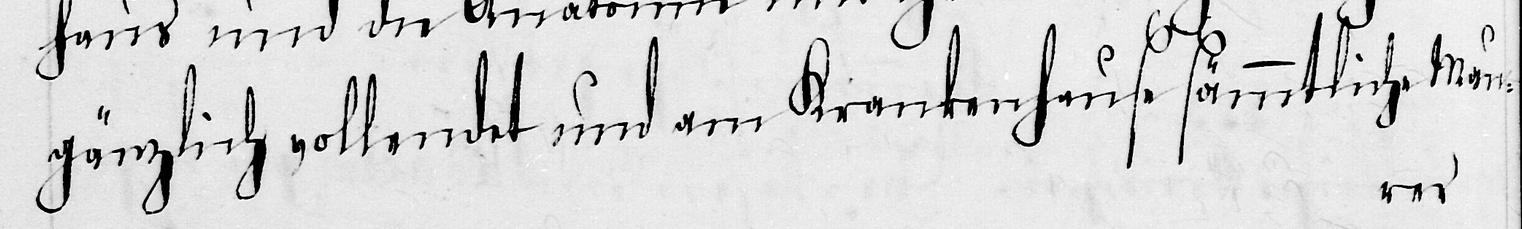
gänzlich vollendet und am Krankenhause sämmtliche Ma¬
